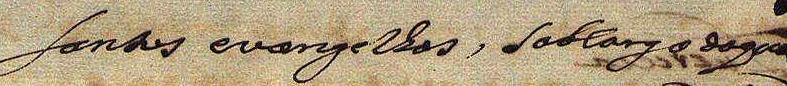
santos evangelhos, sob cargo do que
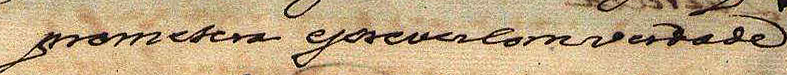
prometera escrever com verdade
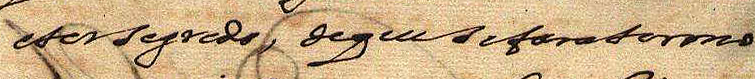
e ter segredo de que se fara termo
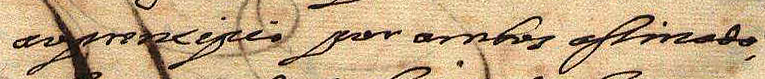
ao principio por ambos assinado
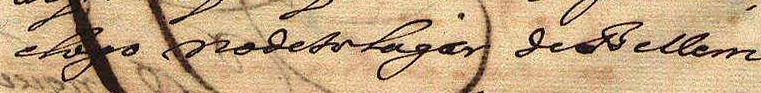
e logo no dito lugar de Bellem
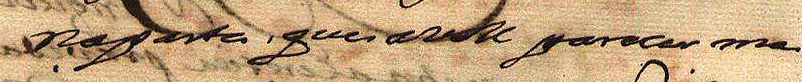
na parte, que a vM parecer ma
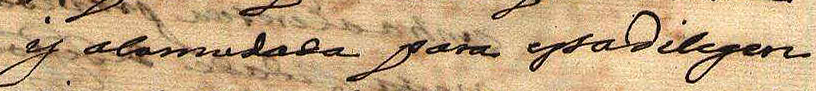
is acomodada para esta dilegen
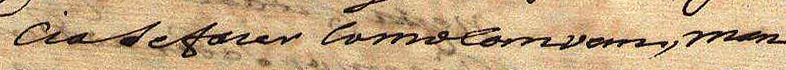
cia se fazer como comvem, man
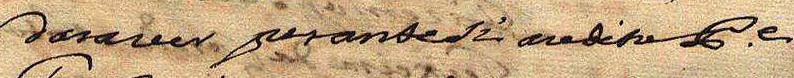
dara vir perante si ao dito P.e
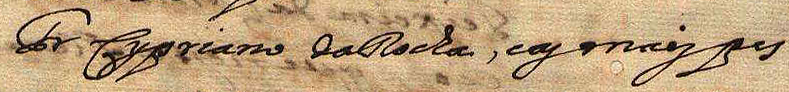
Fr Cypriano da Rocha, e as mais pes
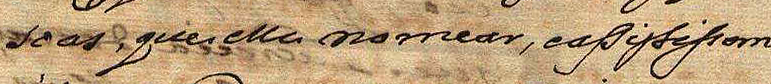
soas, que elle nomear, e assistissem
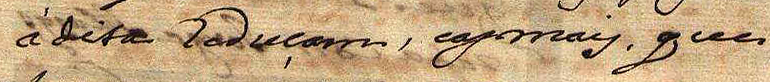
á dita Reduçam, e as mais, que
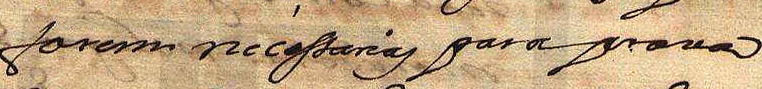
forem necessarias para prova
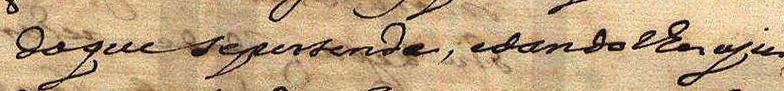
do que se pertende, e dandolhe o ju
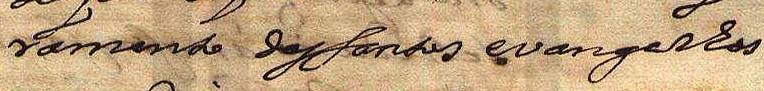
ramento dos Santos evangelhos
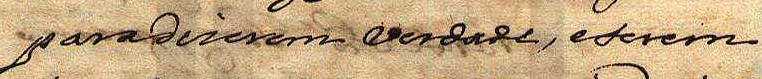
para dizerem verdade, e terem
